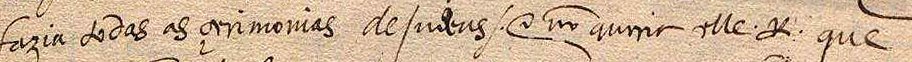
fazia todas as çerimonias de Judeus /. e n̄o queria elle .R. que
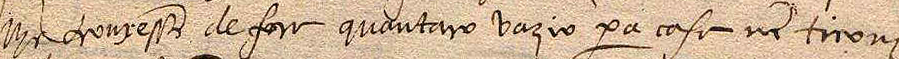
lhe trouxessē de fora quantaro vazio ꝑa casa nē ticom
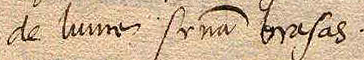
de lume sen̄a brasas.
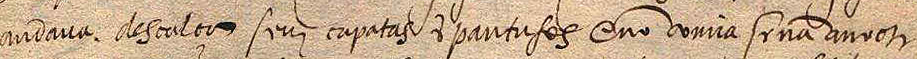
andaua descalça sem capatas ē pantufos e n̄o comia senā a nocte
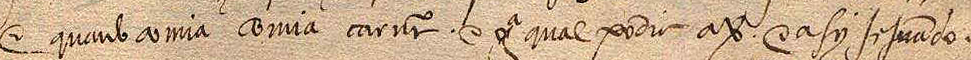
e quando comia comia carnro . e ga qual podia aꝟ. e asy Jejūado.
